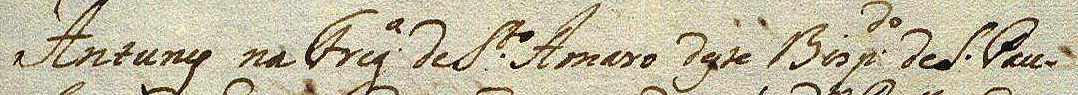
Antunes na Freg.a de S.to Amaro deste Bisp.do de S. Pau
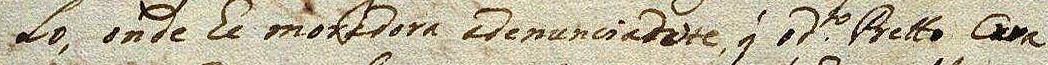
Lo, onde he moradora a denunciadote, q̄ o d.o Pretto Cura
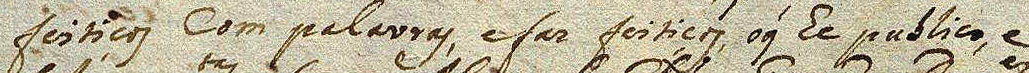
feitiços Com palavras, e faz feiticos, o q̄ he publico, e
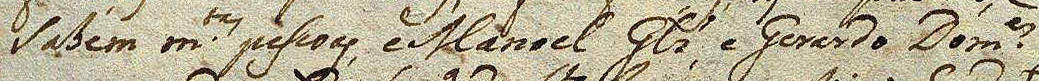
sabem m.tas pessoas, e Manoel Glz̄, e Gerardo Dom.es
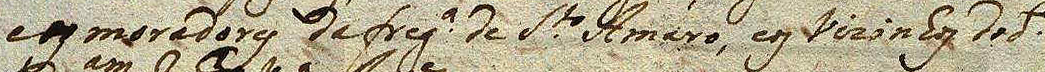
e os moradores da freg.a de S.to Amaro, e os Vizinhos do d̄.o
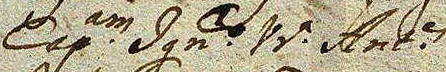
Cap.am Ign.co Vr.a Ant.es
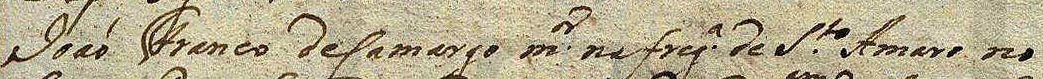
Ioaõ Franco de Camargo m.or na freg.a de S.to Amaro no
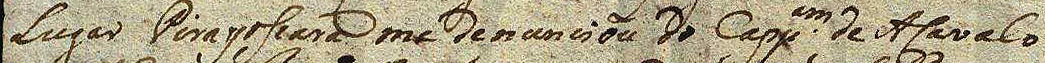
Lugar Pirajossara me denunciou do Capp.am de ACavalo
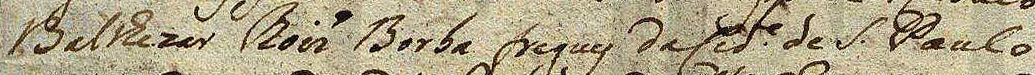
Balthezar Roiz̄ Borba fregues da Cid.e de S. Paulo
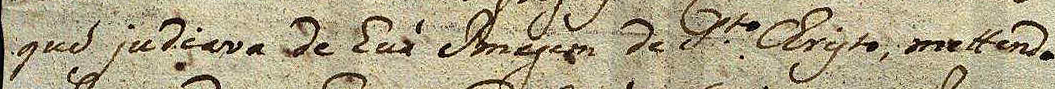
que judiava de huā Imagem de S.to Christo, mettendo
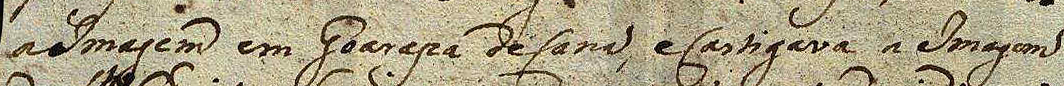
a Imagem em Goarapa de Cana, e Castigava a Imagem
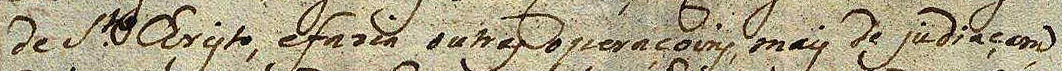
de S.to Christo, e fazia outras operaçoens, mais de judiaçam
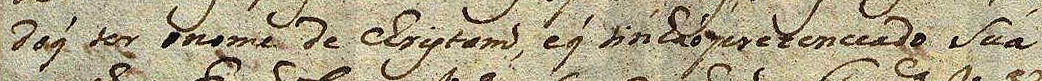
do q̄ ter o nome de christam, e q̄ tinhaõ prezenciado sua
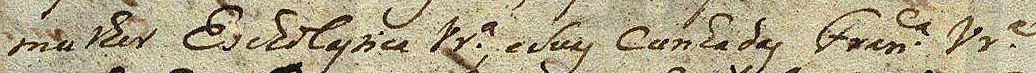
mulher Escholastica Vr.a, e suas Cunhadas Fran.ca Vr.a
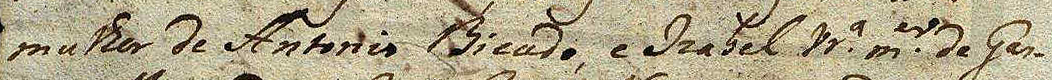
mulher de Antonio Bicado, e Izabel Vr.a m.er de Gas
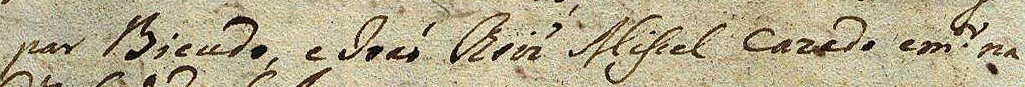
par Bicudo, e Ioaõ Roiz̄ Missel cazado e m.or na
